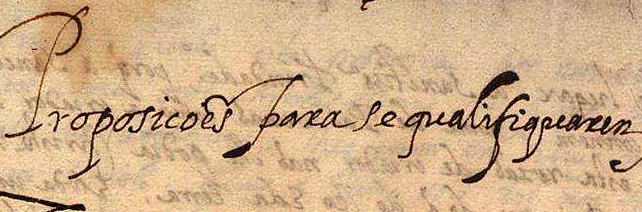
Proposiçoẽs para se qualifiquaren
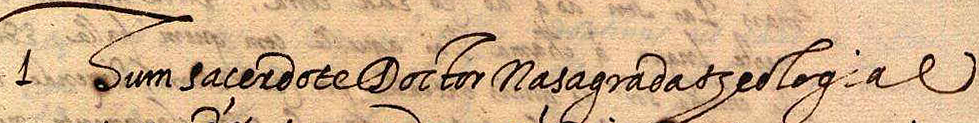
1 hum sacerdote Doctor na sagrada theologia e
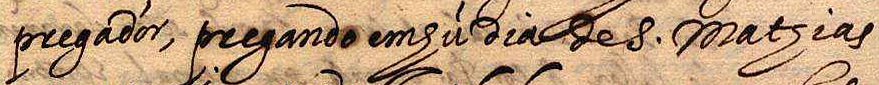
pregador, pregando em hū dia de S. Mathias
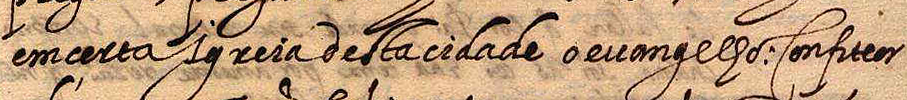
em certa Igreia desta cidade o euangelho: Confiteor
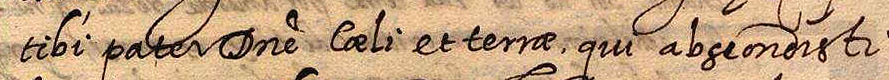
tibi pater Dnē Cæli et terræ, qui abscondisti
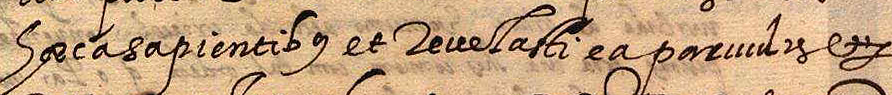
hæc a sapientibꝯ et Reuelasti ea paruulis &ꝭ.
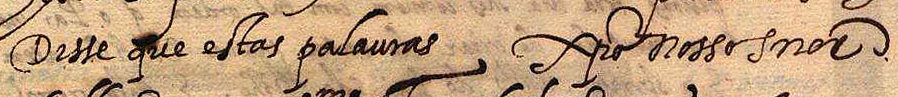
Disse q̄ estas palauras Xpō nosso snor̄
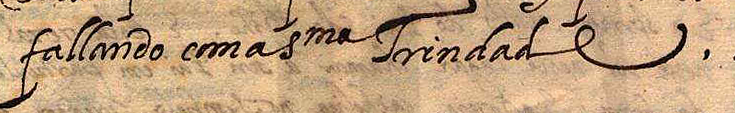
fallando com a sma Trindade.
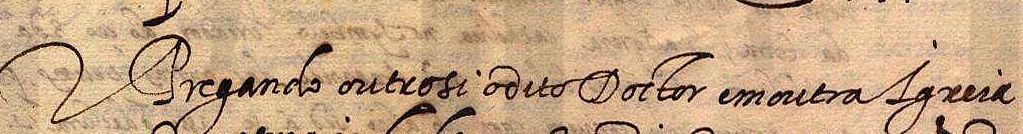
2 Pregando outrosi o dito Doctor em outra Igreia
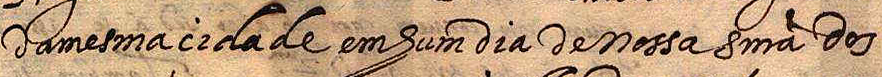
da mesma cidade em hum dia de nossa snrā dos
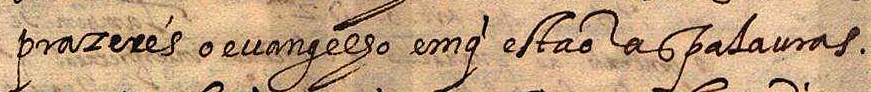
prazeres o euangelho em q̄ estaõ as palauras.
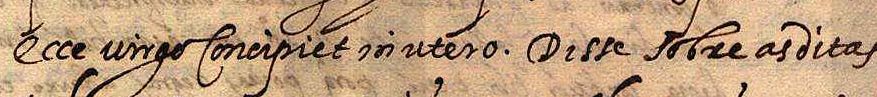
ecce uirgo Concipiet in utero. Disse sobre as ditas
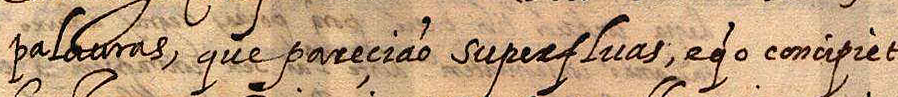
palauras, que pareciaõ superfluas, e q̄ o concipiet
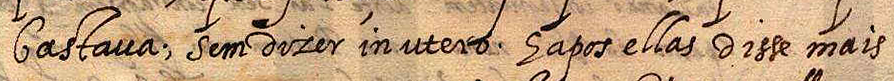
bastaua; sem dizer in utero. E apos ellas disse mais
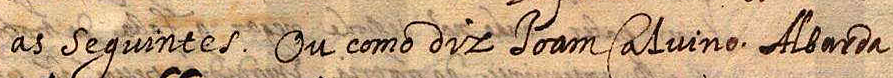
as seguintes. Ou como diz Ioam Caluino. Albarda
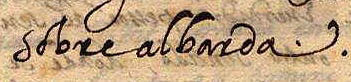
sobre albarda.
